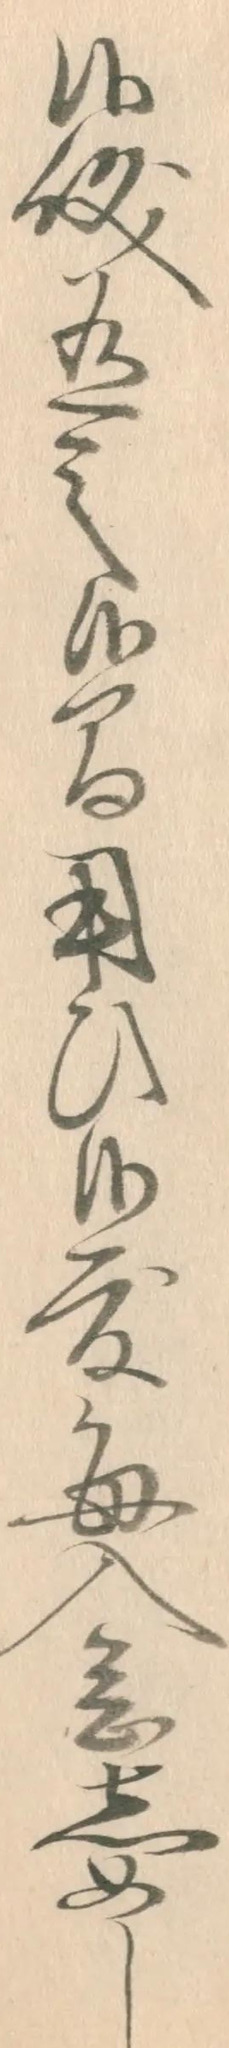候儀有之候間用ひ候度毎入念しめし
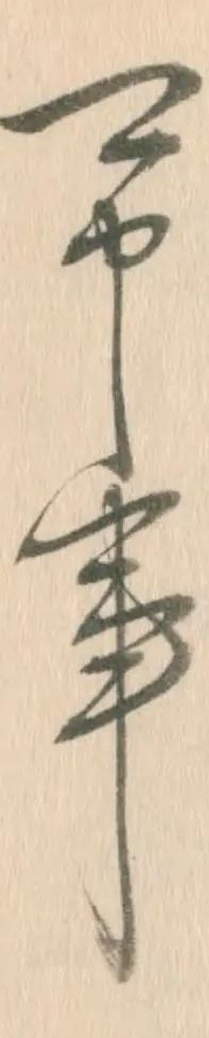可申事
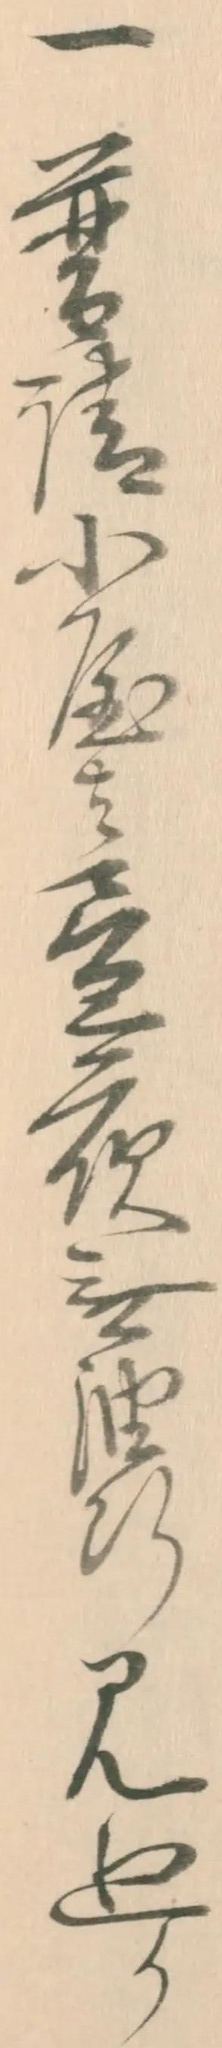一普請小屋は昼夜無油断見廻り
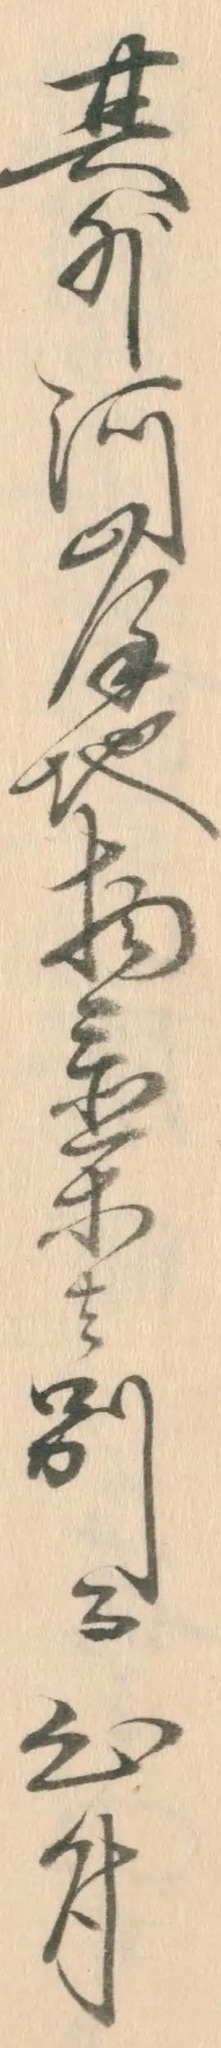其外河岸地物置等は別而心付
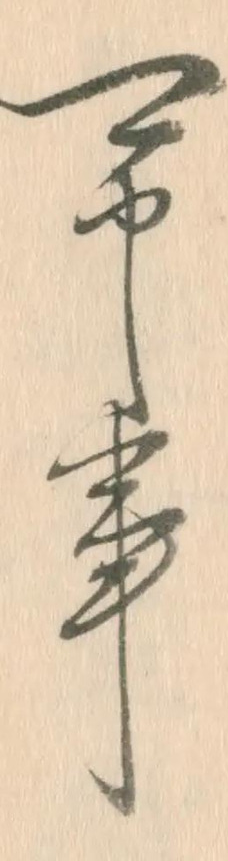可申事
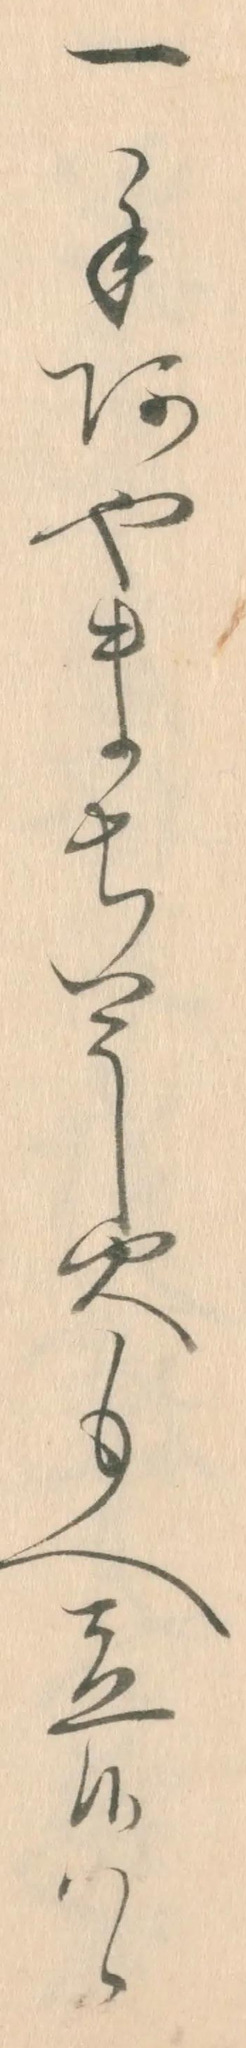一手あやまちいたし火もへ立候ハヽ
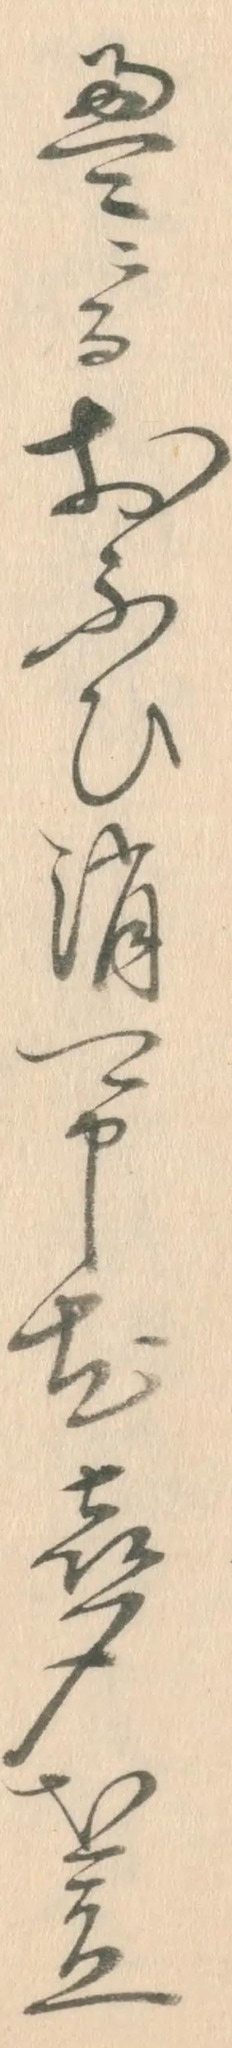畳ニ而おふひ消可申尤声を立
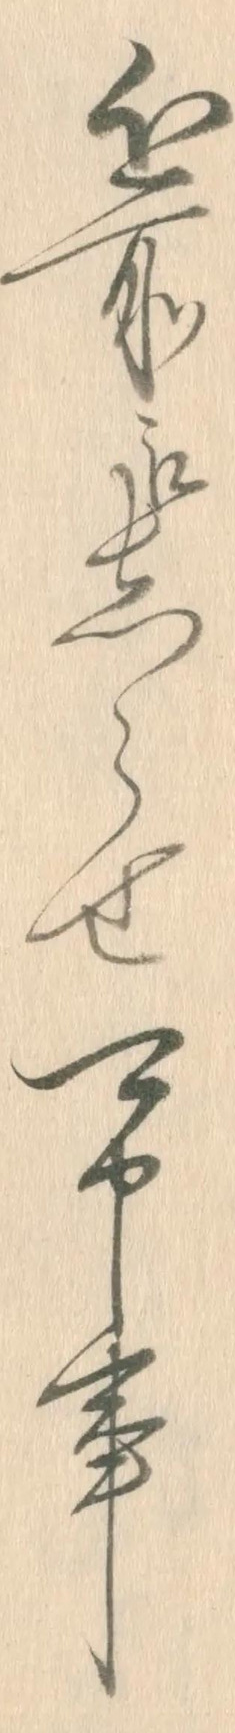近所えしらせ可申事
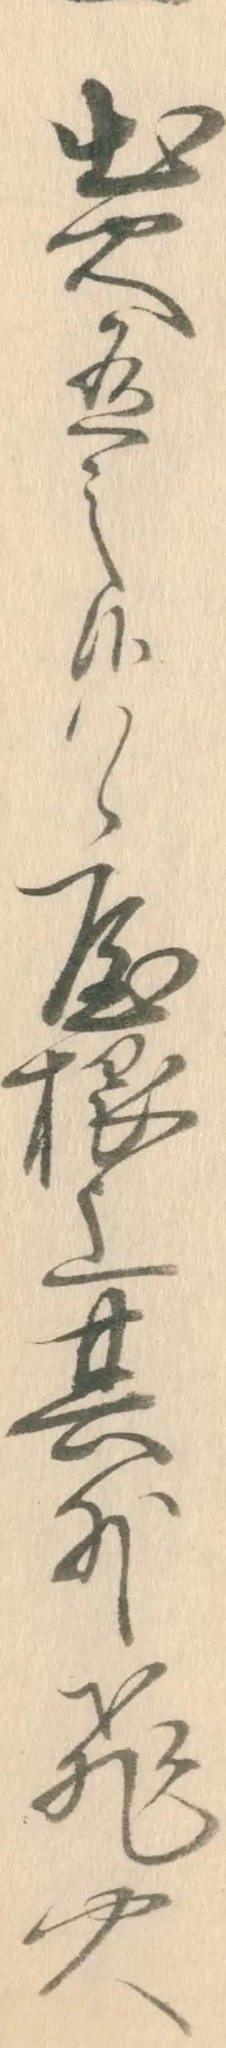一出火有之候ハヽ屋根上其外飛火

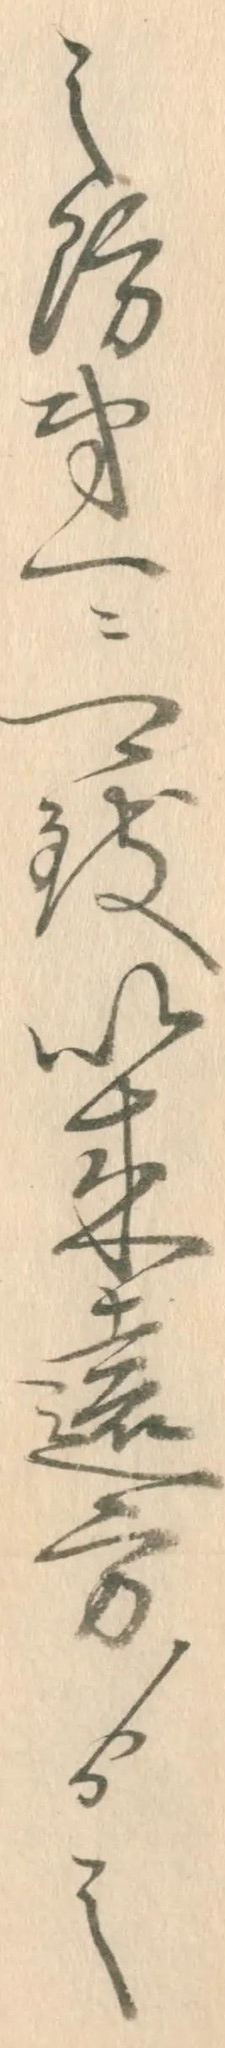之防第一ニ可致以来遠方ゟ之
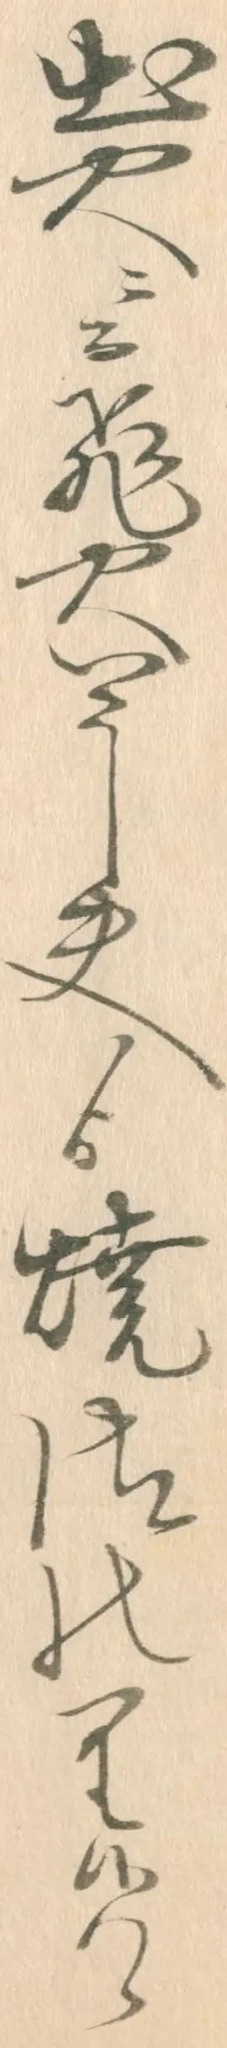出火ニ而飛火いたし夫ゟ焼つのり候ハヽ
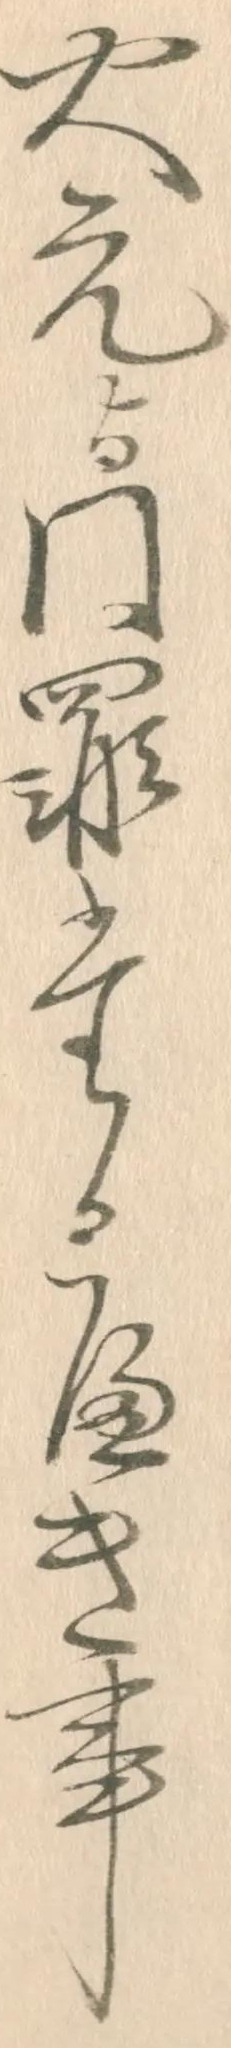火元と同罪たるへき事
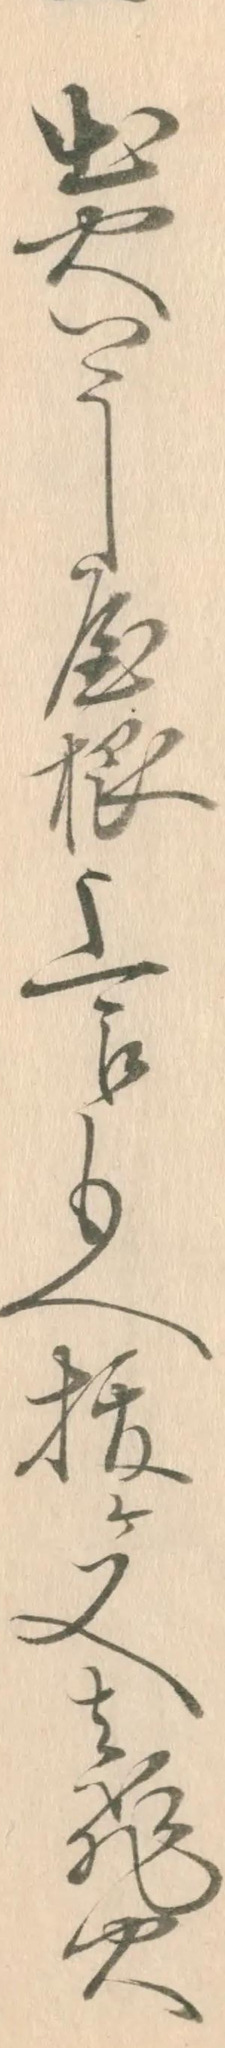一出火いたし屋根上えもへ抜ケ又は飛火
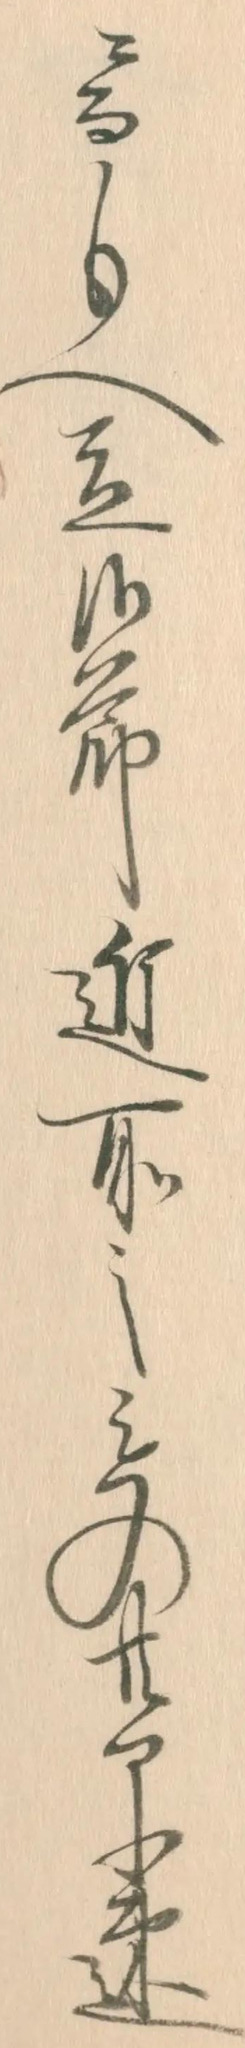ニ而もへ立候節近所之もの共早速
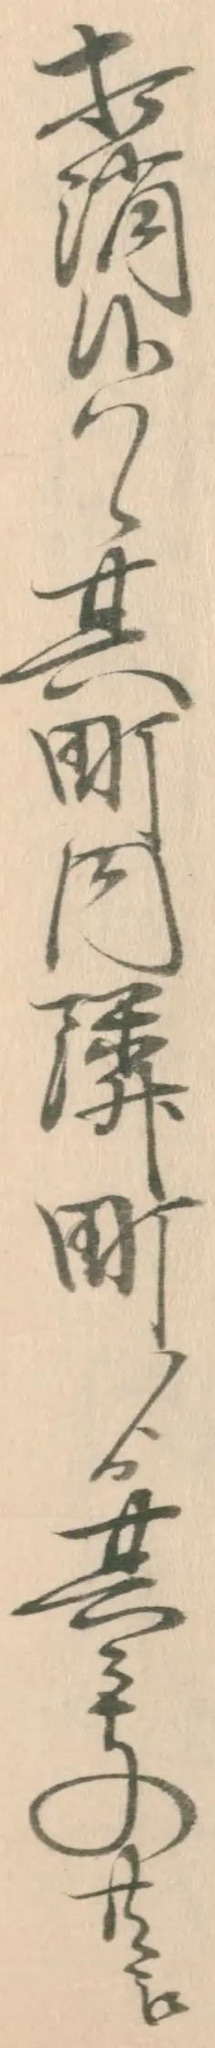打消候ハヽ其町内隣町ゟ其もの共え
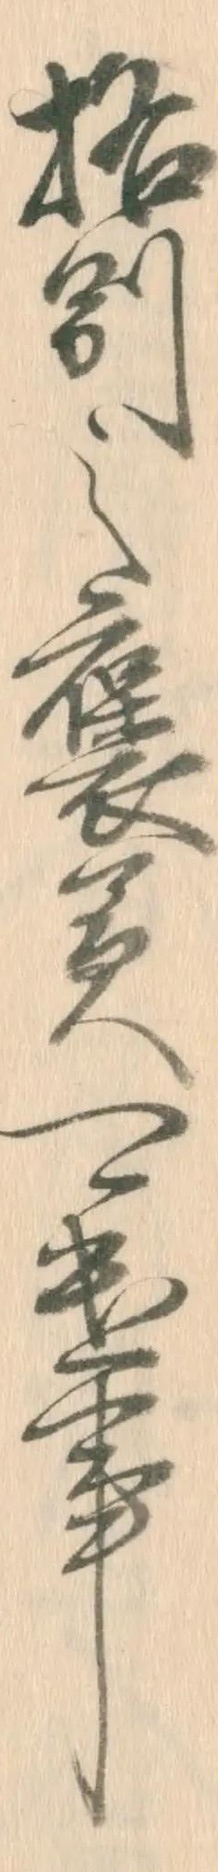格別之褒美可遣事
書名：三橋 17巻. [7] 三橋小破御修復書留　但御奉行御掛リ替地震潰橋番屋　嘉永四亥年より安政二卯年迄　上
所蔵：国立国会図書館 National Diet Library, JAPAN
